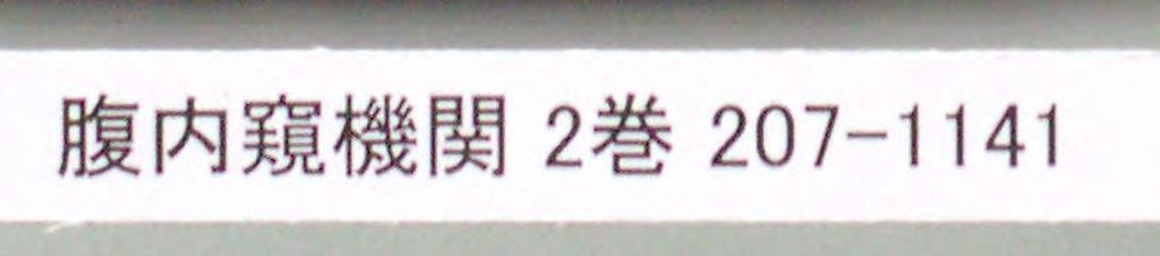腹内窺機関
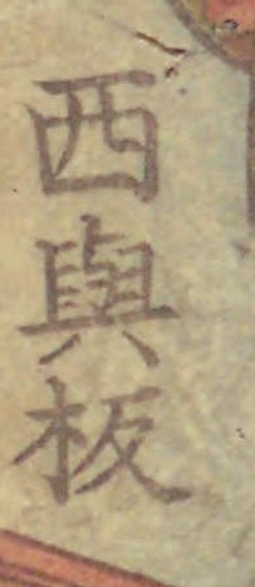西與板

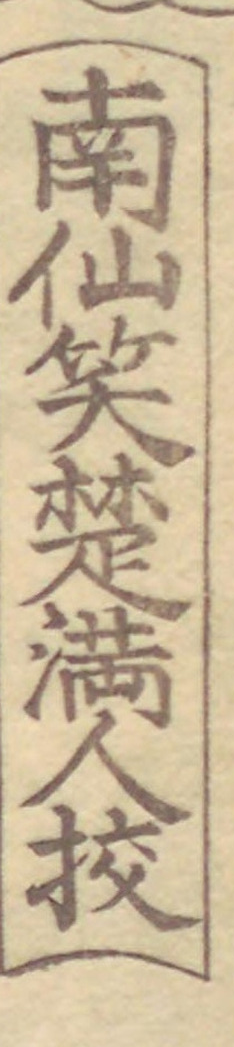南仙笑楚満人挍
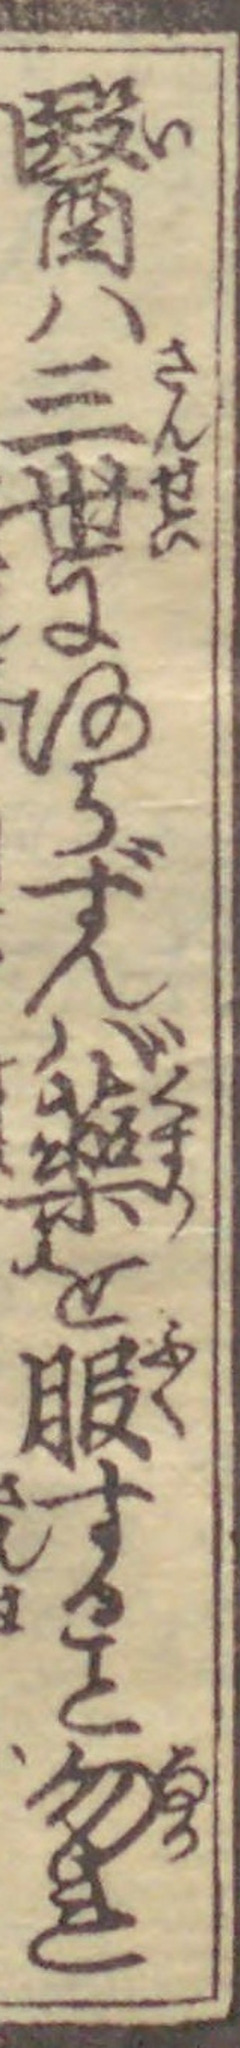医は三世にあらずんば薬を服すること勿れ
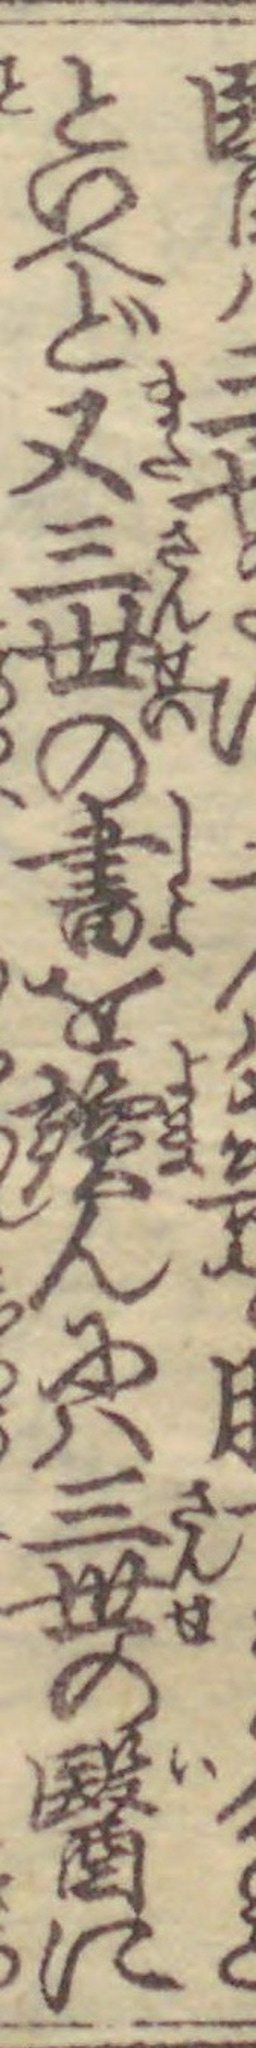といへど又三世の書を読んには三世の医に
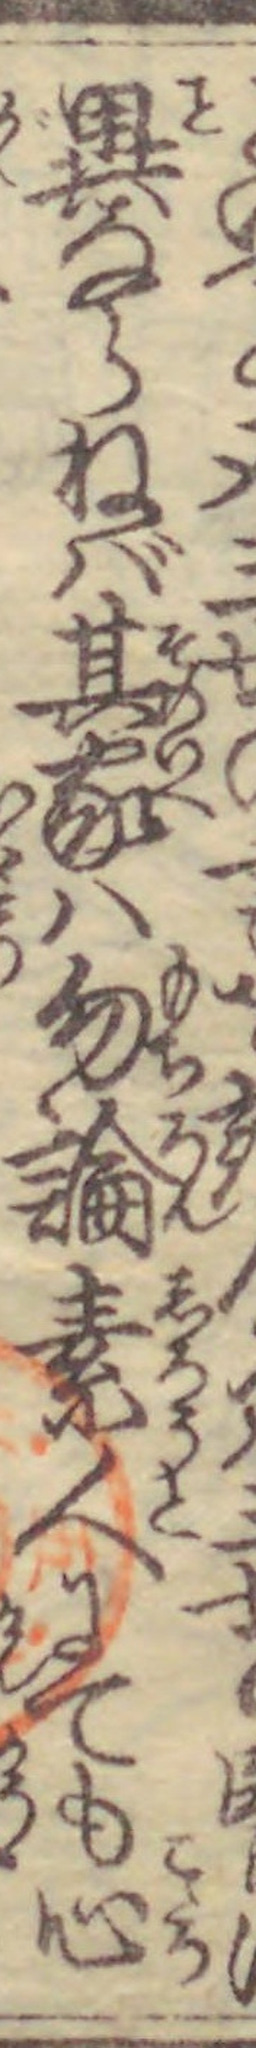異ならねば其家は勿論素人にても心
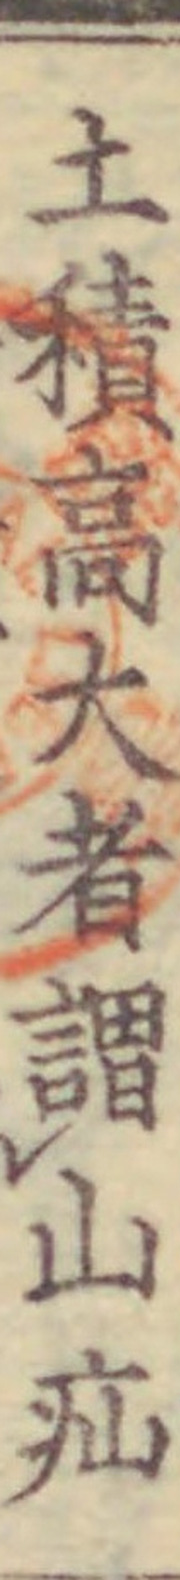土積高大者謂山疝
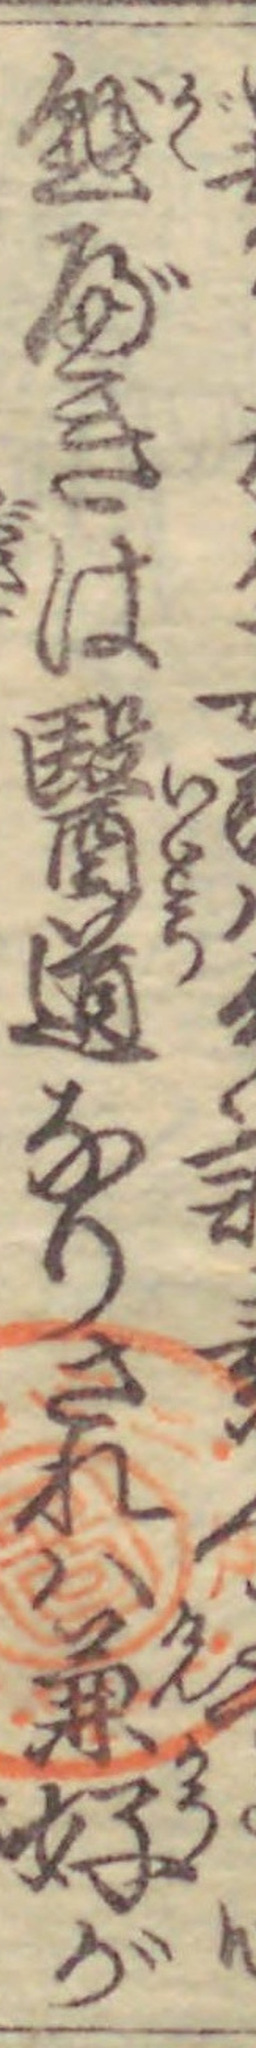懸べきは医道なりされは兼好が
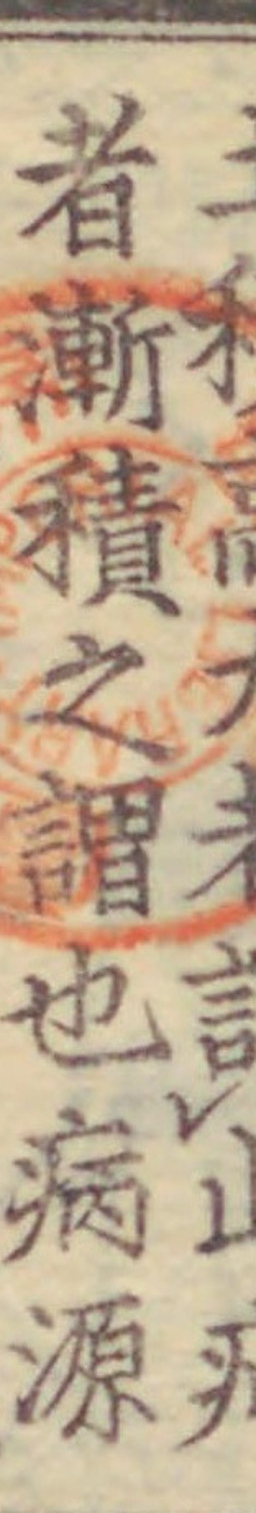者漸積之謂也病源
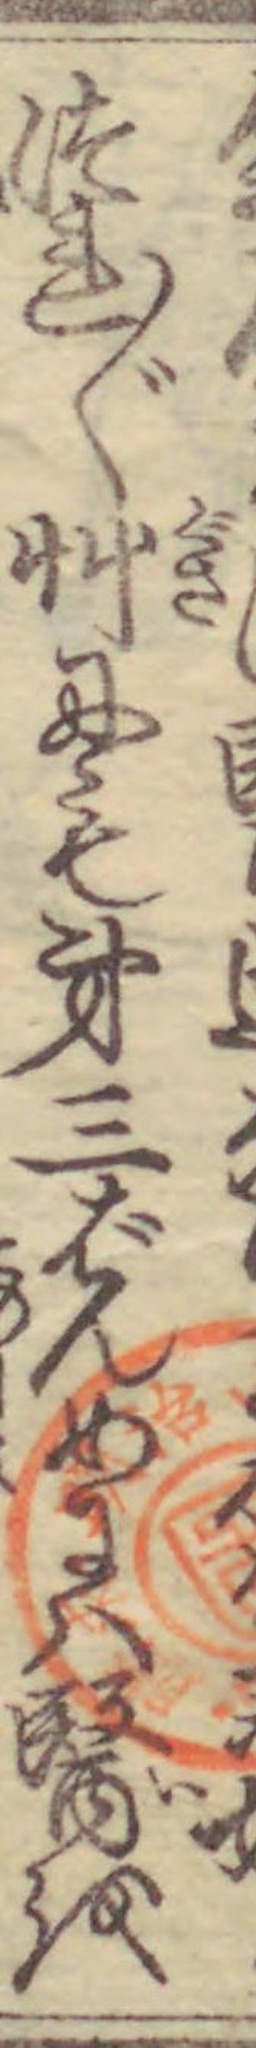つれ〴〵草にも第三ばんめには医を
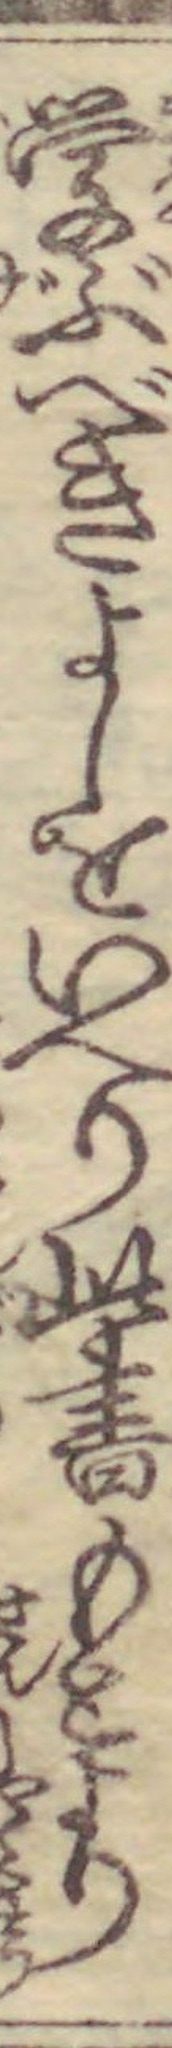学ぶべきよしをいへり此書もとより
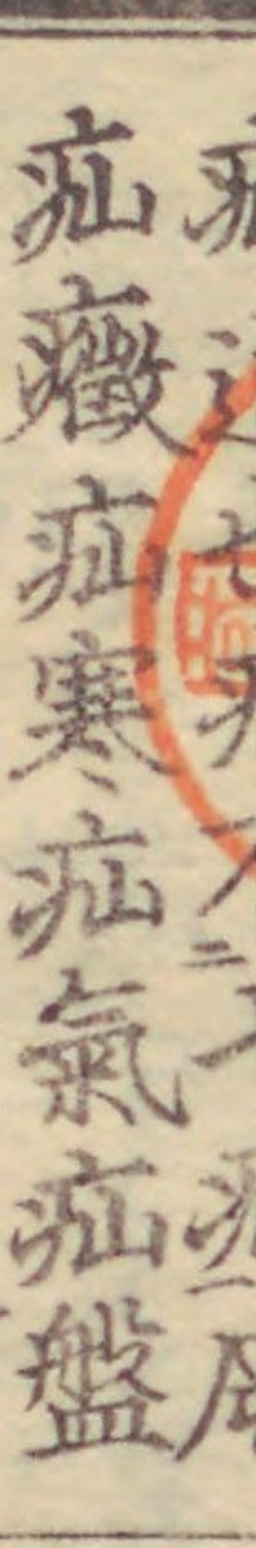疝癥疝寒疝気疝盤
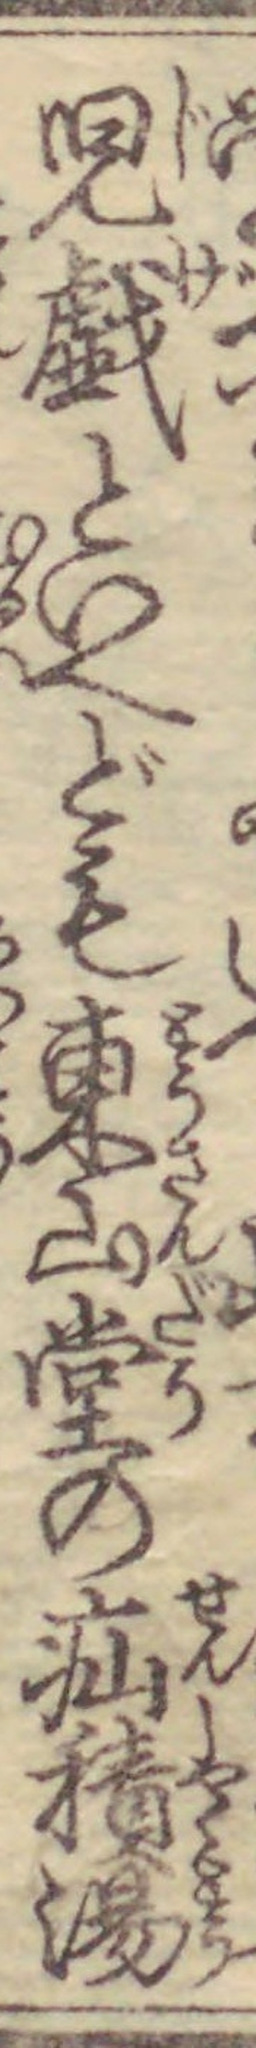児戯といへども東山堂の疝積湯
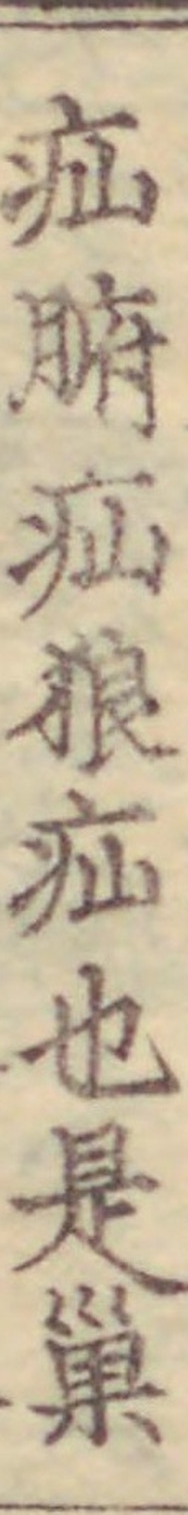疝腑疝狼疝也是巣
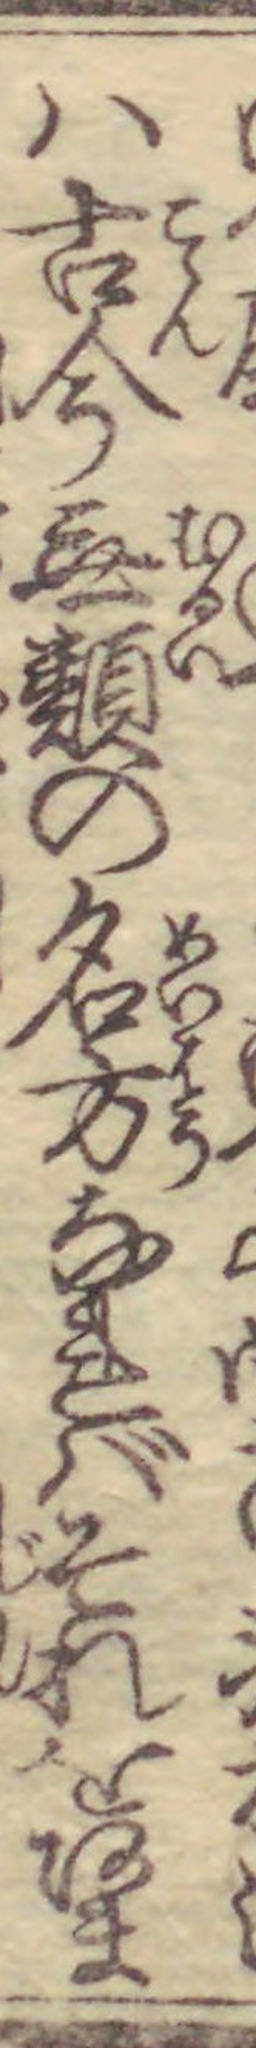は古今無類の名方なればそれをあま
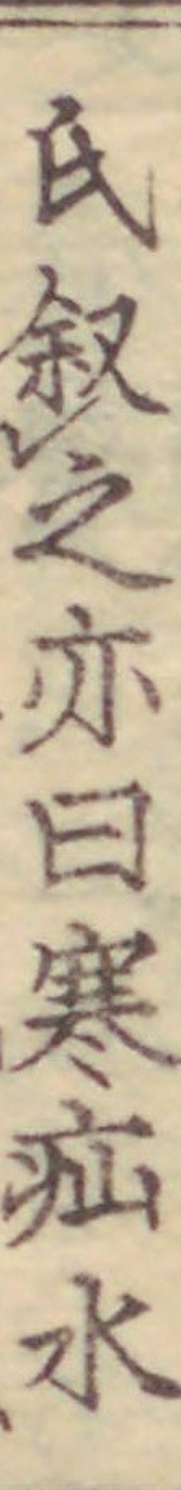氏叙之亦曰寒疝水
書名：腹内窺機関 2巻
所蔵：国立国会図書館 National Diet Library, JAPAN
